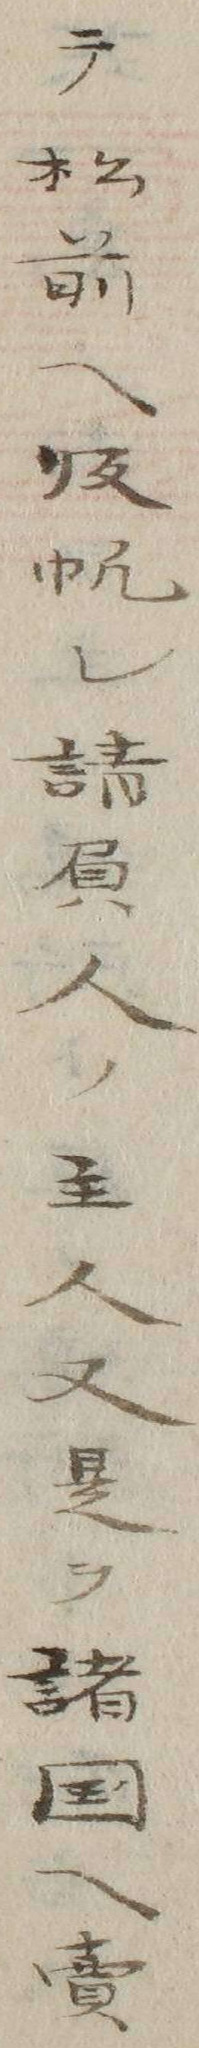テ松前ヘ帰帆シ請負人ノ主人又是ヲ諸国ヘ売
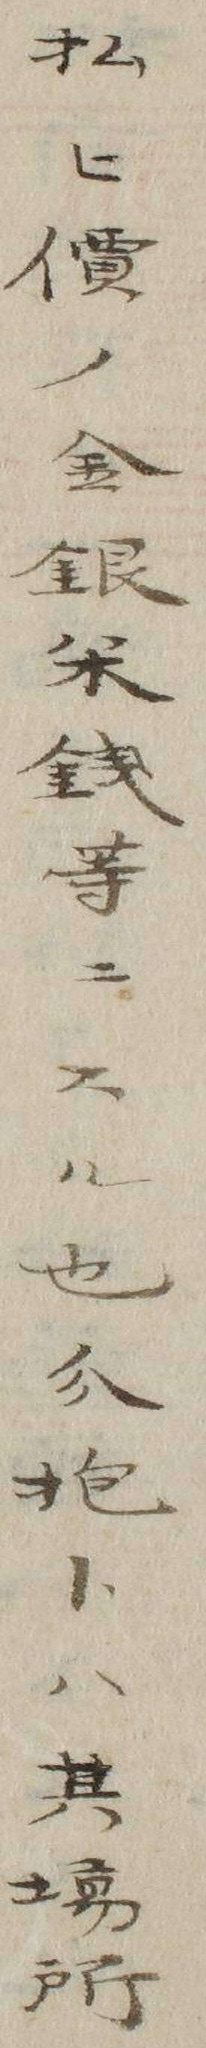払ヒ価ノ金銀米銭等ニスル也介抱トハ其場所
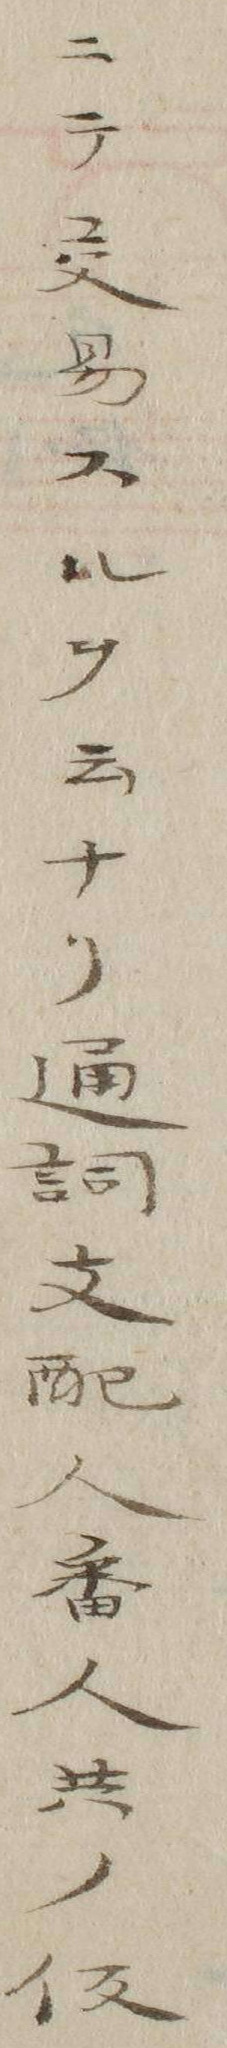ニテ交易スルヲ云ナリ通詞支配人番人共ノ仮
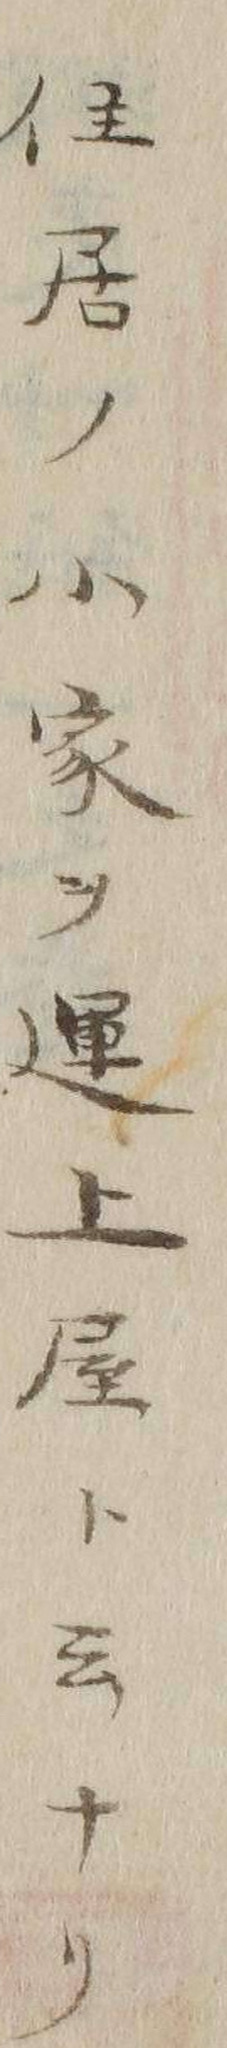住居ノ小家ヲ運上屋ト云ナリ
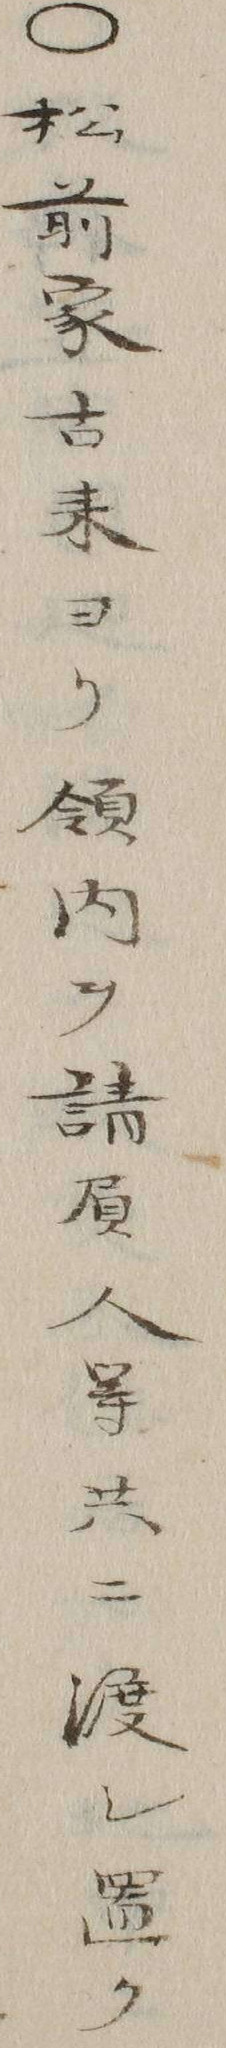○松前家古来ヨリ領内ヲ請負人等共ニ渡シ置ク
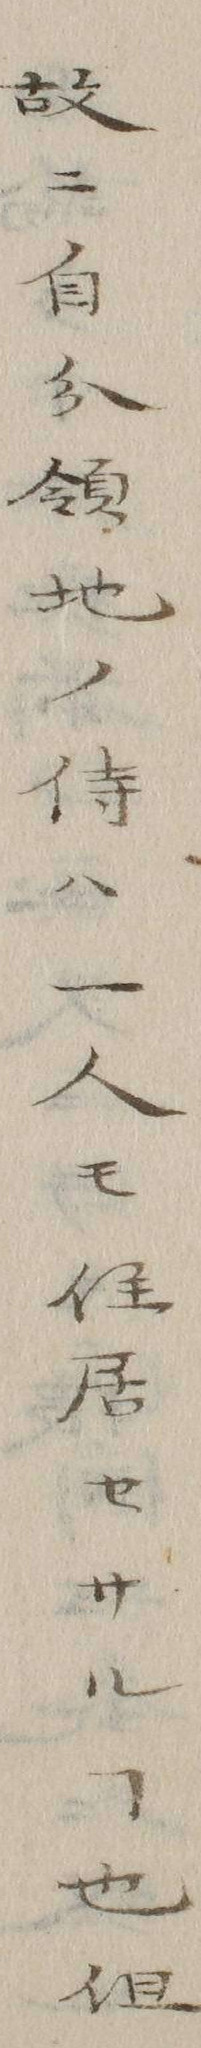故ニ自分領地ノ侍ハ一人モ住居セサルコト也但
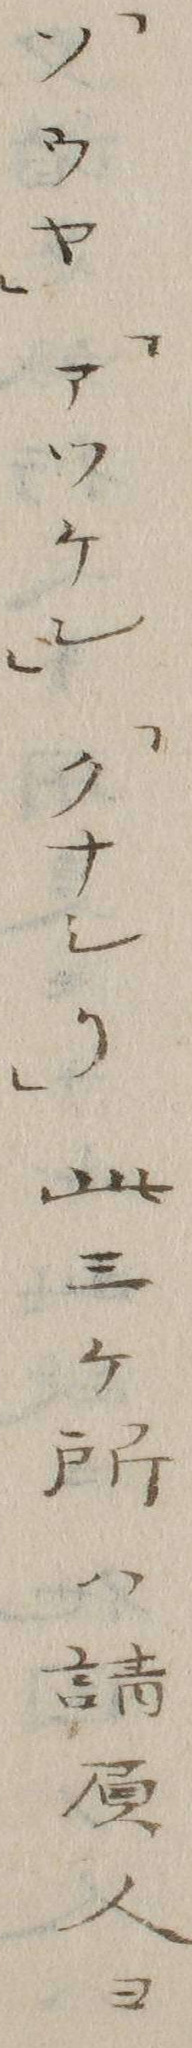「ソウヤ」「アツケシ」「クナシリ」此三ケ所ハ請負人ヨ
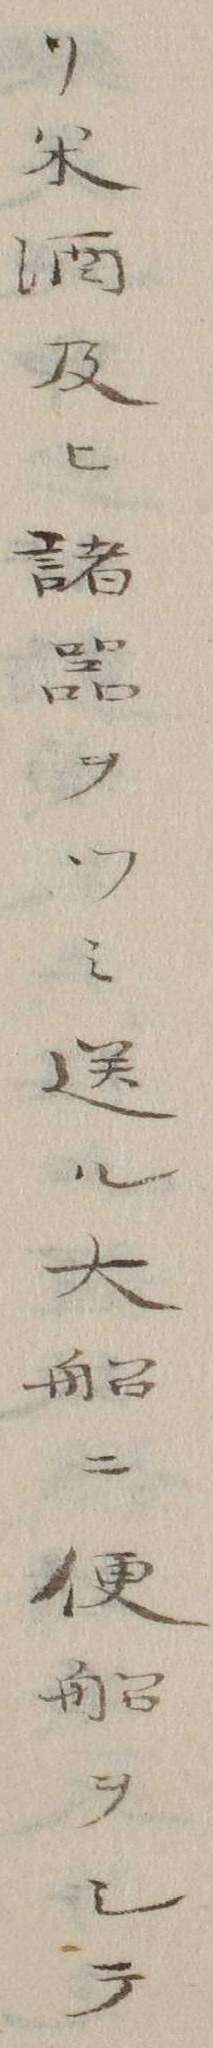リ米酒及ヒ諸器ヲツミ送ル大船ニ便船ヲシテ
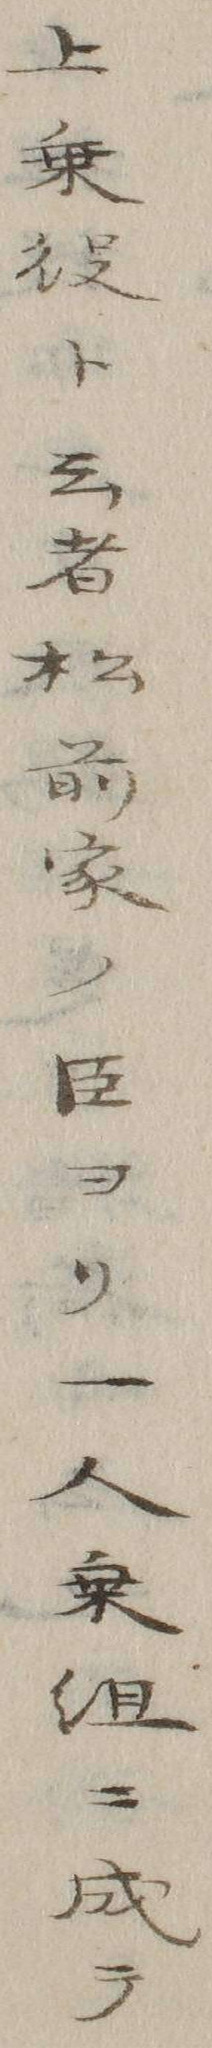上乗役ト云者松前家ノ臣ヨリ一人乗組ニ成テ
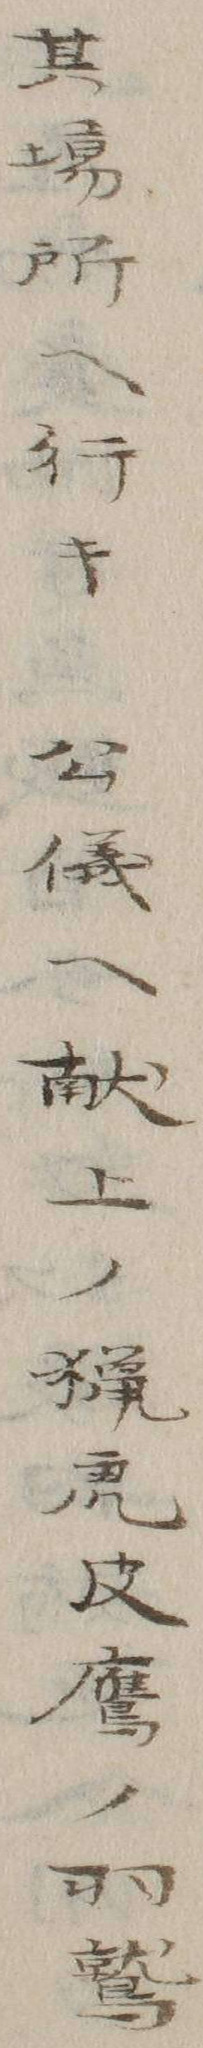其場所ヘ行キ公儀ヘ献上ノ猟虎皮鷹ノ羽鷲
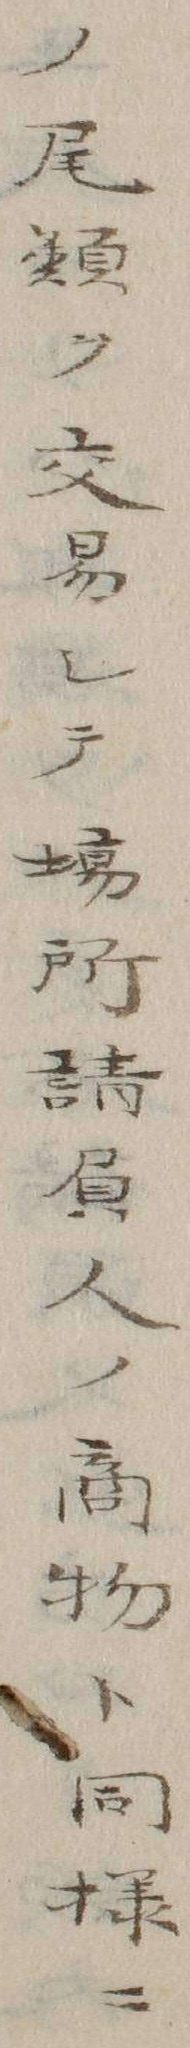ノ尾類ヲ交易シテ場所諸負人ノ商物ト同様ニ
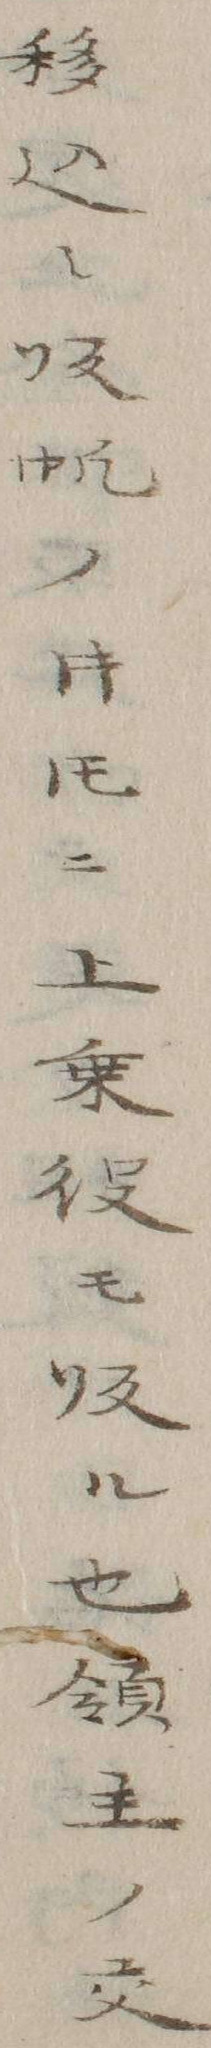移込ミ帰帆ノトキトモニ上乗役モ帰ル也領主ノ交
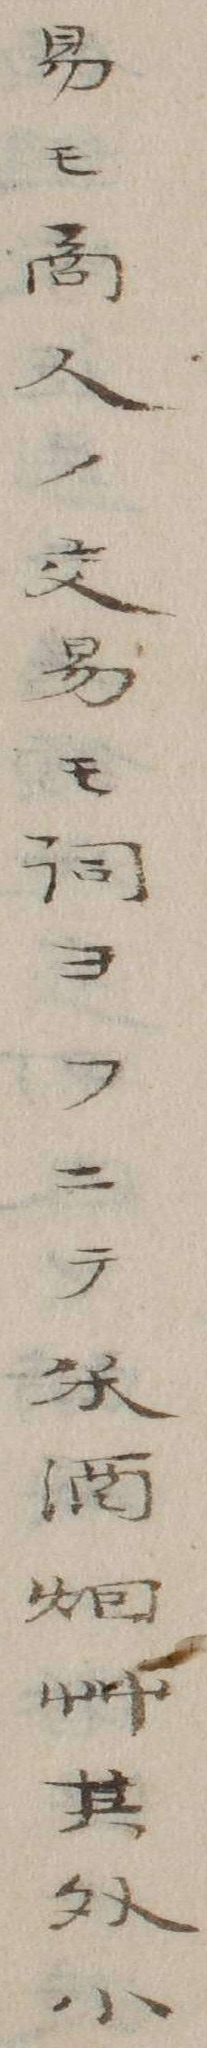易モ商人ノ交易モ同ヨフニテ米酒烟草其外小
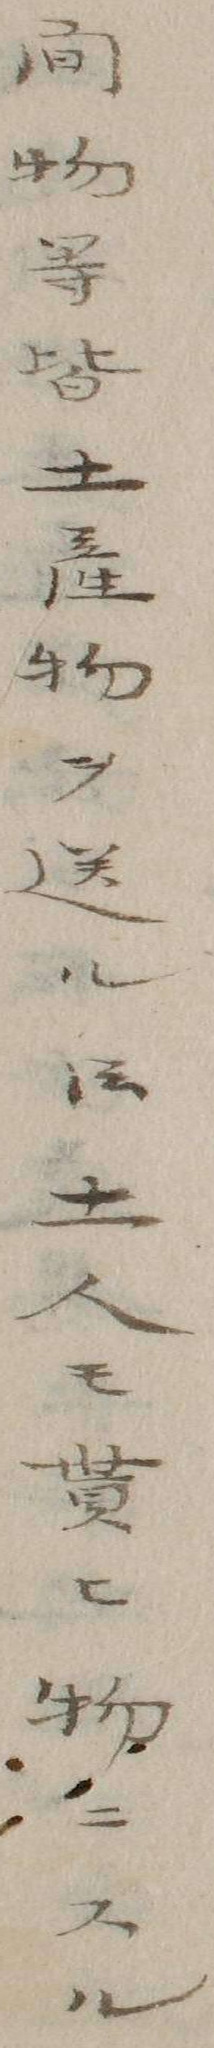間物等皆土産物ヲ送ルト云土人モ貰ヒ物ニスル

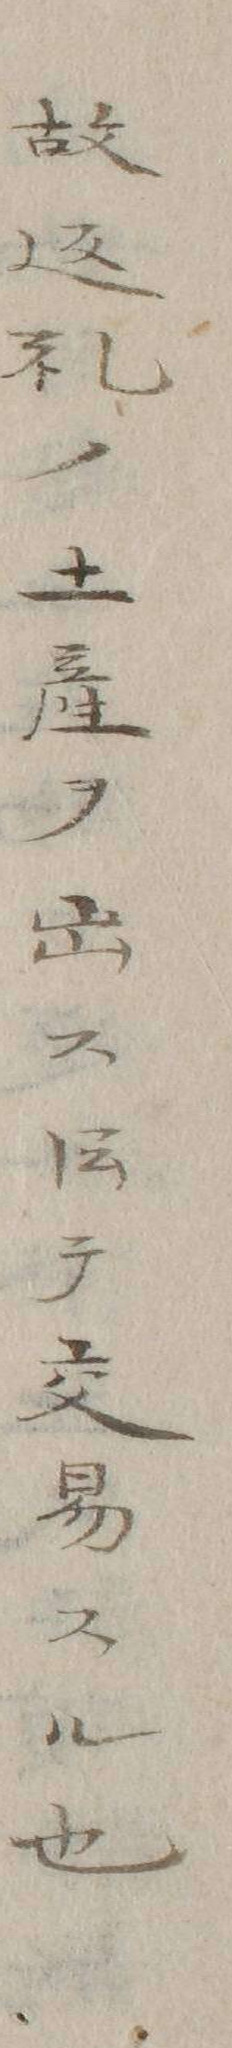故返礼ノ土産ヲ出スト云テ交易スル也
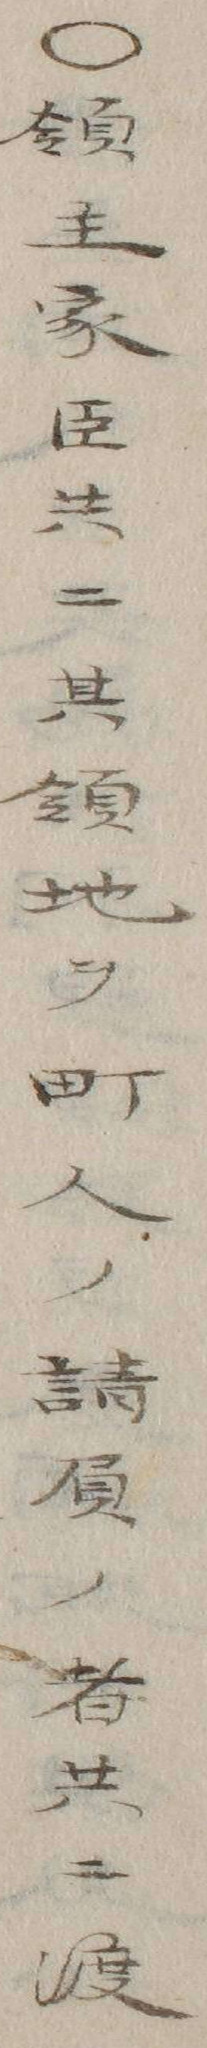〇領主家臣共ニ其領地ヲ町人ノ請負ノ者共ニ渡
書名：蝦夷草紙（国文学研究資料館）
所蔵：国文学研究資料館
